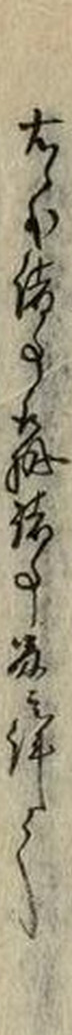右之外諸事取扱諸事留ニ詳之
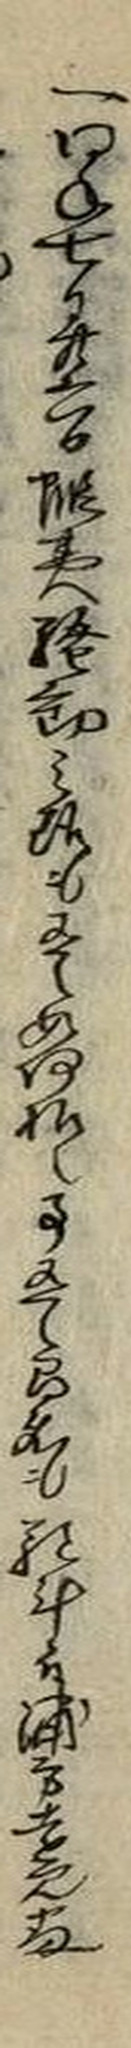一同年七月廿六日能美騒動之趣も有之如何様之事有之間敷も難計ニ付浦方遠見番
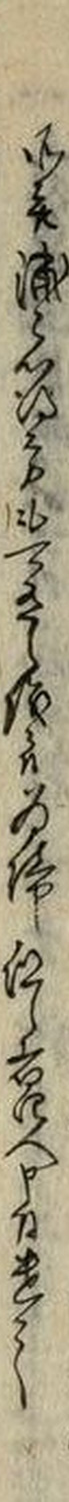所幷浦々心得方も可有之儀ニ付為締組之者四人申付遣之
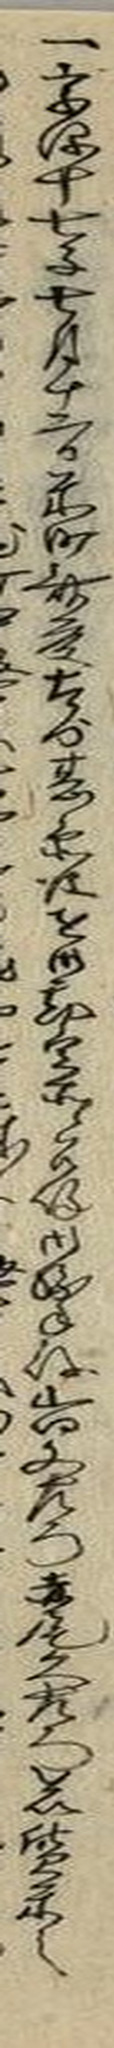一享保十七子七月十二日米町斎藤太右衛門甚兵衛儀を御勘定所へ召呼御勝手役山田文左衛門赤尾久左衛門を以質米之
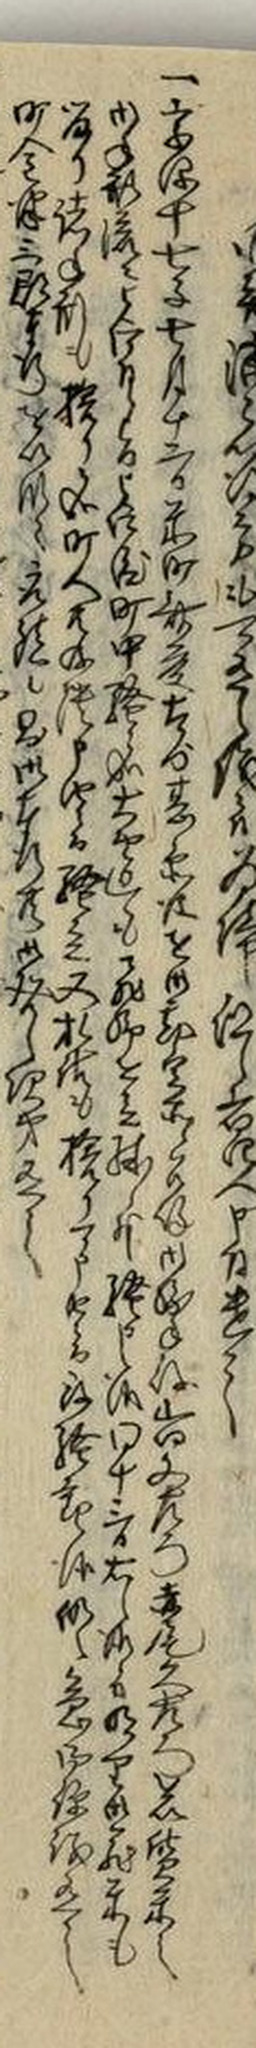御手形流ニ被仰付候旨被仰渡町中騒ニ成大野辺へも飛脚を立殊之外騒申候趣同十三日右之趣ニ付明里御蔵米も
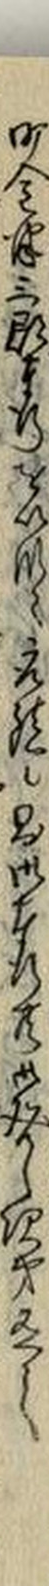町金津三郡奉行を以段々取鎮候則御奉行共御咎之次第有之
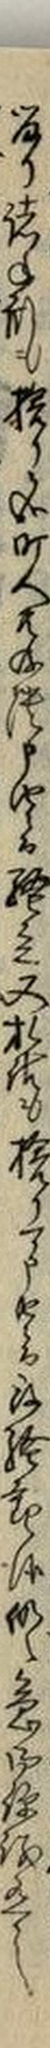留り諸手形も捨りニ成町人共及潰申由ニ而騒立又札佐も捨り可申由ニ而致騒動候趣依之急御評議有之
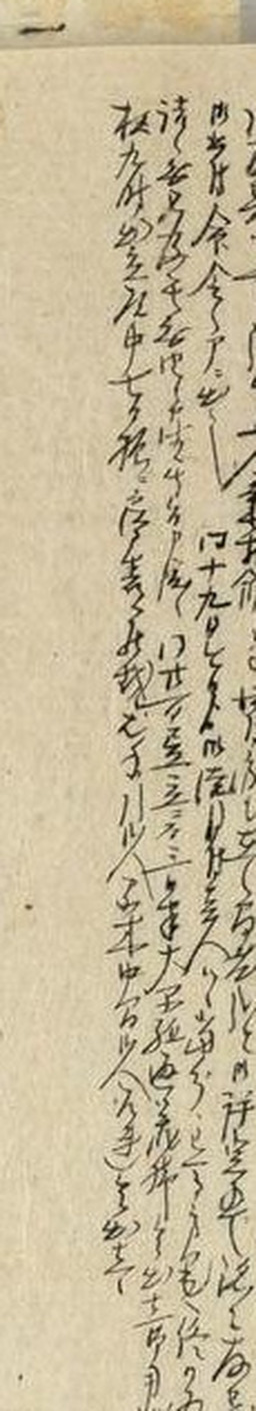夜九時出立道中七日振ニ而江戸表へ罷越尤手引弐人家来中間弐人召連令出立候

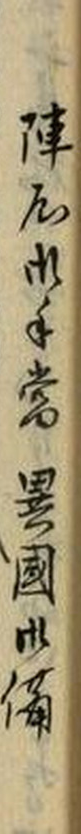陣屋御手当異国御備
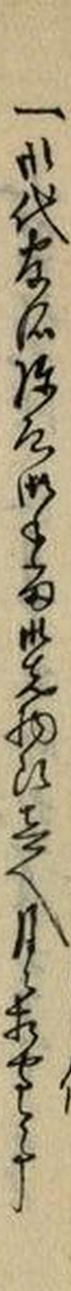一御代官所陣屋御手当御先物頭壱人月々相守候事
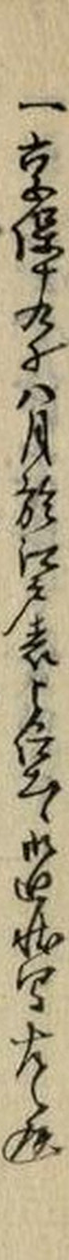一享保十九寅八月於江戸表被仰出候御廻状写左之通
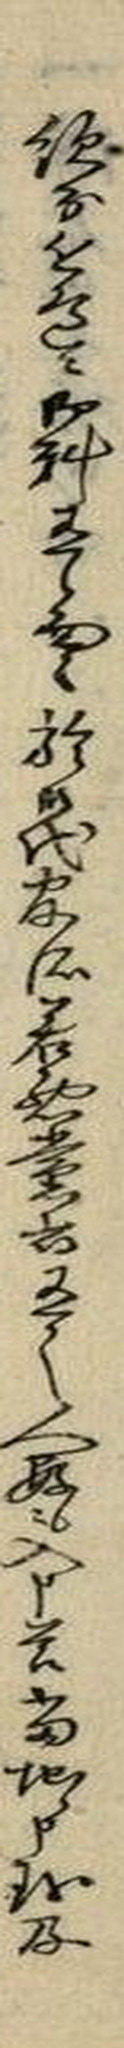領分近辺ニ御料有之面々於御代官所若悪党者有之人数も入申節当地へ申越及
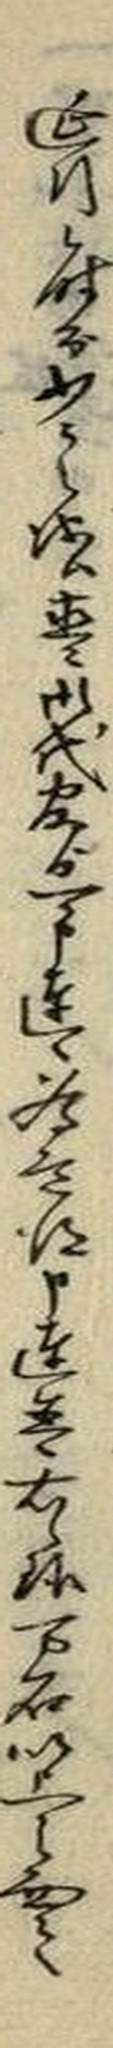延引候時分少々之儀ハ直ニ御代官ゟ可申達候為意得申達置候右之趣万石以上之面々
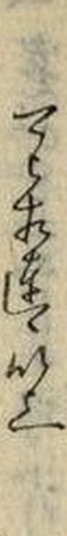可被相達候以上
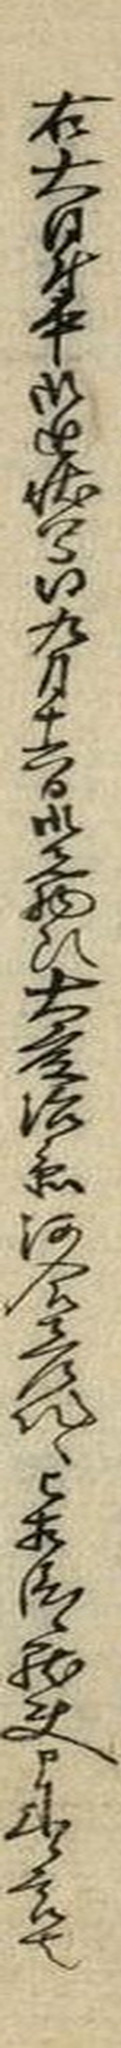右大目付中御廻状写同九月十六日御先物頭大藤治兵衛河合彦作へ被相渡候就夫申来候節者
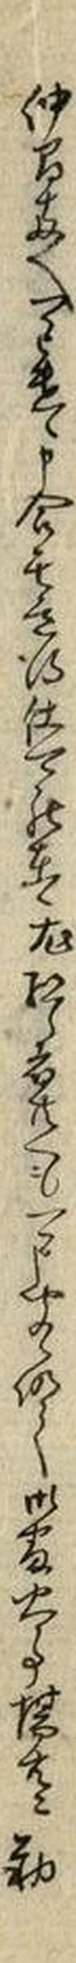仲間両人可被遣候申合其意得仕可罷在候尤組之者共へも可申聞候依之御番火事場共ニ勤
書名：御国他国諸事之部
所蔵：福井県文書館 Fukui Prefectural Archives
